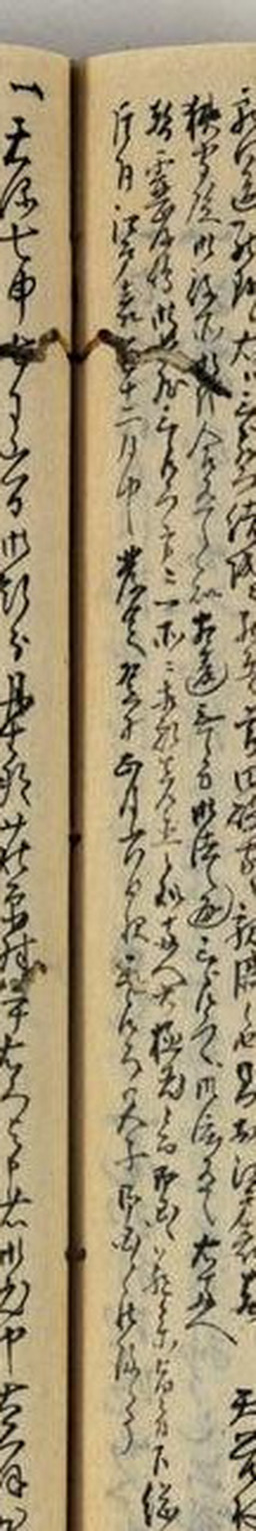片付江戸表十二月中発足翌寅正月六日夜三郎左衛門父子御国へ罷帰候事
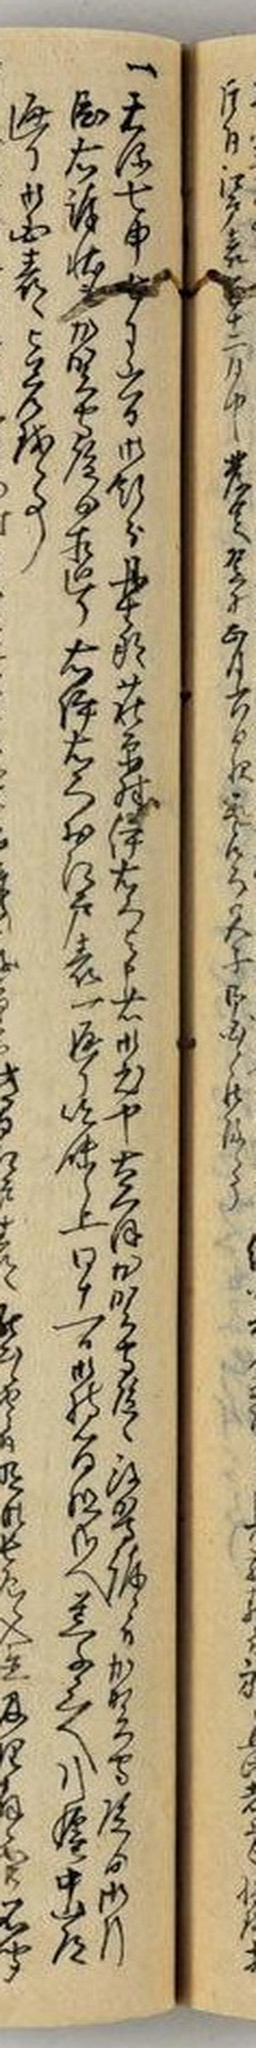一天保七申七月六日御領分丹生郡萩原村伊左衛与申者御老中大久保加賀守殿へ致駕訴候ニ付加賀守殿ゟ御引
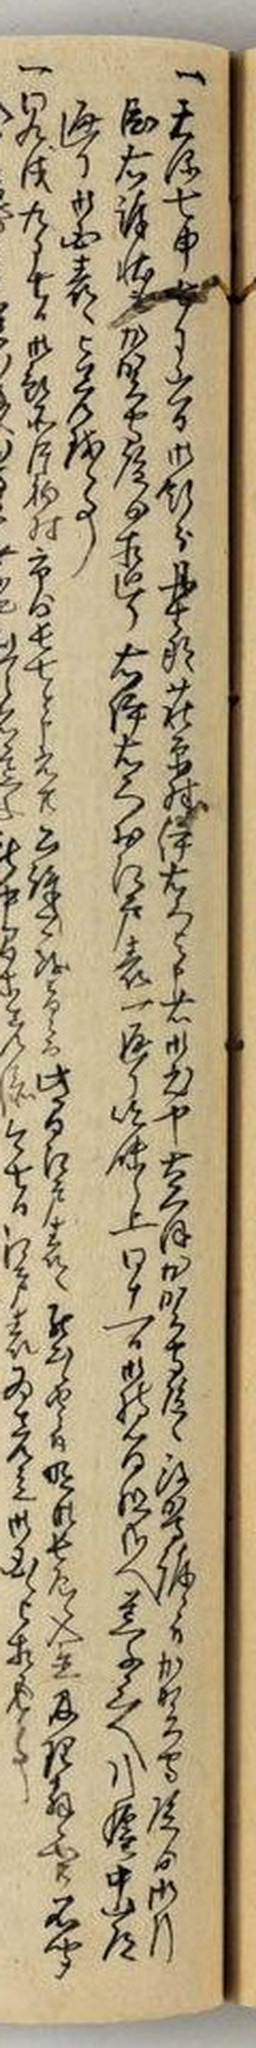渡右訴状も加賀守殿ゟ相廻り右伊左衛門於江戸表一通り吟味之上同十一日御持筒組弐人荒子三人引纏中山道
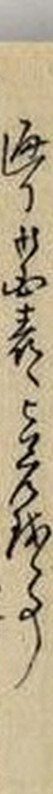通り御国表へ被差越候事
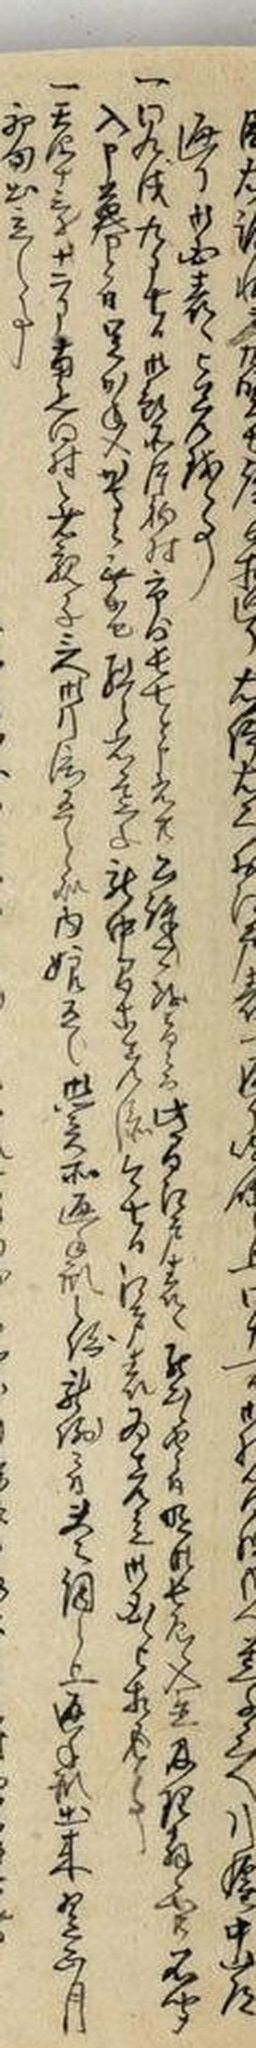入申募候付足かね入駕ニ乗セ組之者荒子新中間等差添今七日江戸表為差立御国へ被相返候事
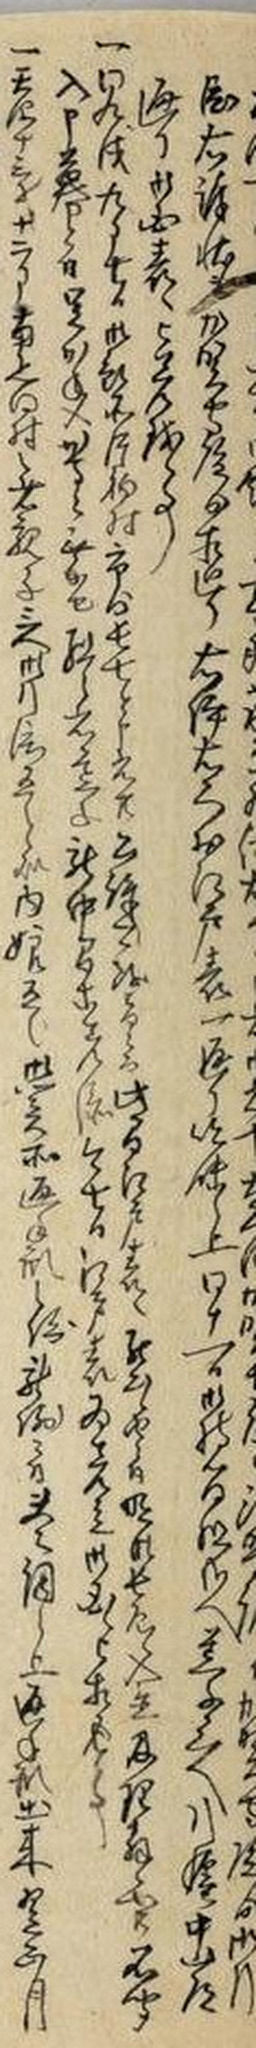一同九戌九月七日御預所片柏村市右衛門長七と申者共公訴可致旨ニ而此間江戸表へ罷出候由ニ付明御長屋へ入置及理解候へ共不聞
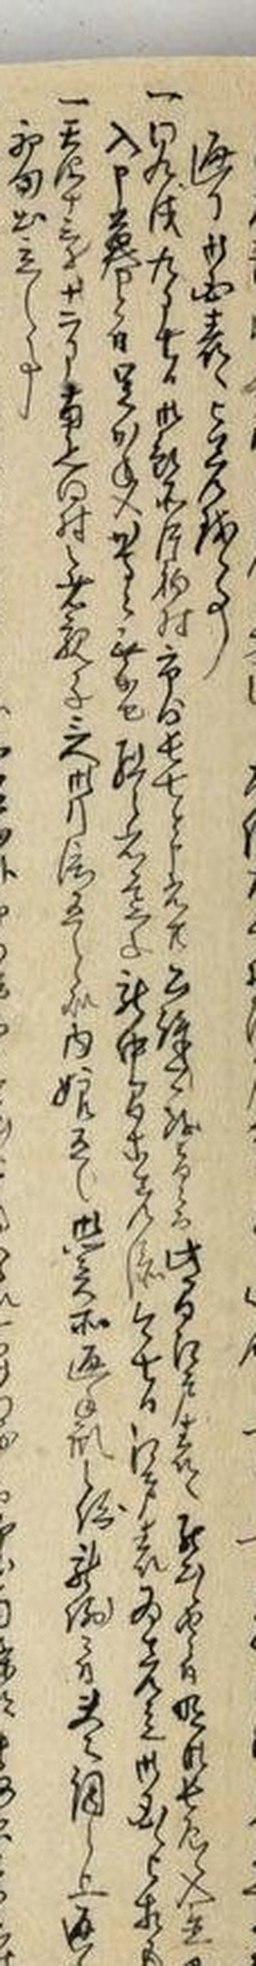入申募候付足かね入駕ニ乗セ組之者荒子新中間等差添今七日江戸表為差立御国へ被相返候事
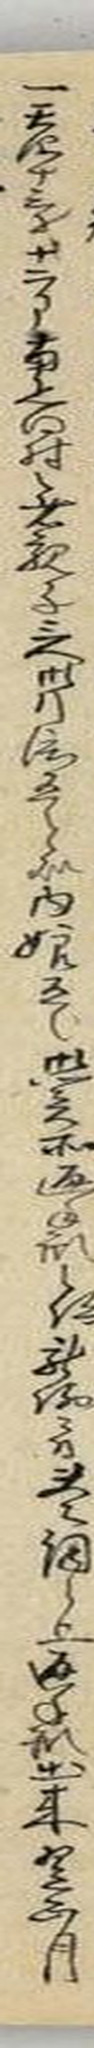一天保十三寅十二月南疋田村之者親子三人御引渡有之候所内娘有之御関所通手形之儀新例ニ付夫々調之上通手形出来翌正月
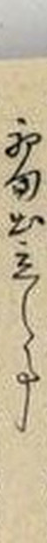初旬出立之事
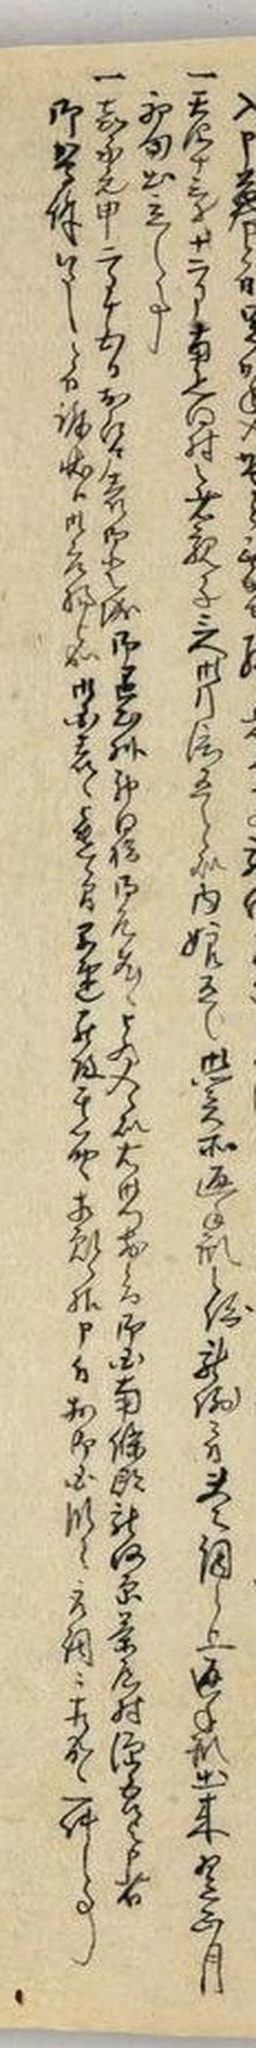一嘉永元申二月十五日於江戸表御登城御退出掛神田橋御屋敷へ被為入候処右御門前ニ而御国南條郡新河原茶屋村源五郎与申者
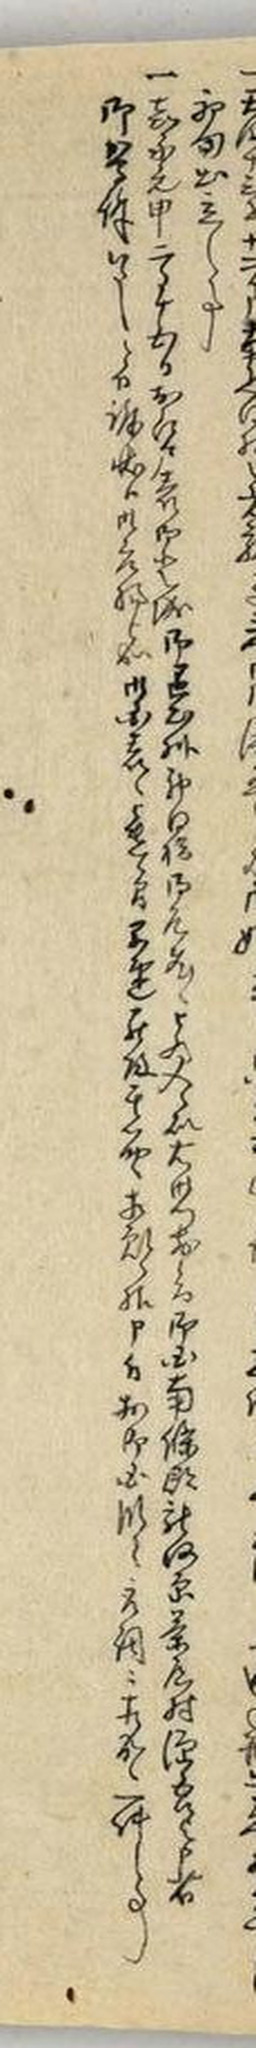御駕訴いたし候ニ付訴状ハ御取揚被成御国表へ被遣候間早速罷帰其筋へ相願候様申付於御国段々取調ニ相成候一件之事

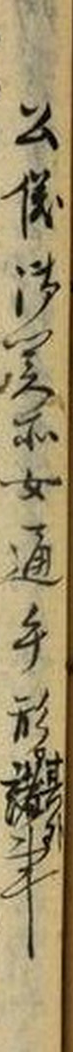公儀御関所女通手形其外事
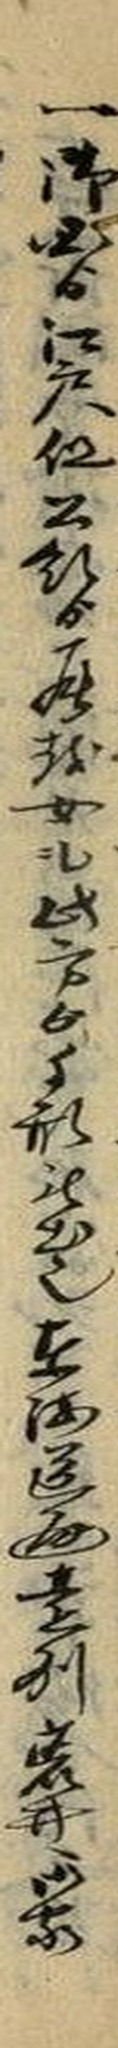一御国ゟ江戸へ但公領ゟ罷越女も此方ゟ手形被出也東海道通遠州荒井へ御家
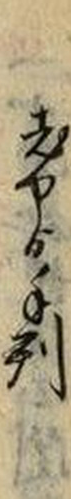老中ゟ手判
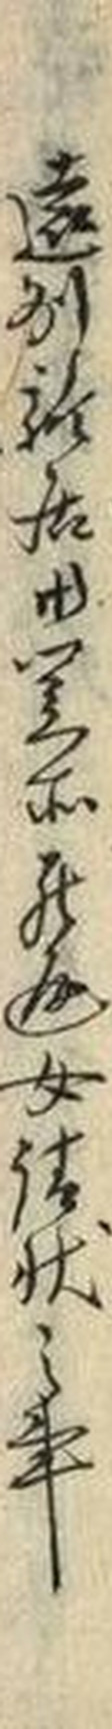遠州新居御関所罷通女請状之事
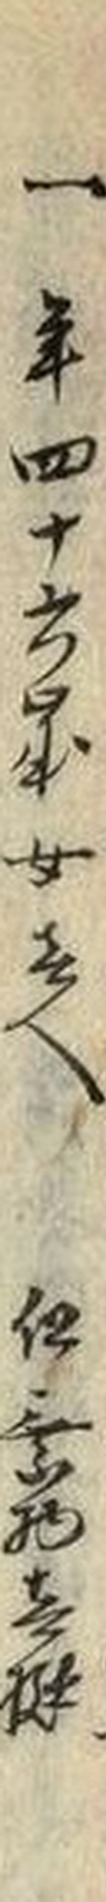一年四十六歳女壱人但乗物壱挺
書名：御国他国諸事之部
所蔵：福井県文書館 Fukui Prefectural Archives
